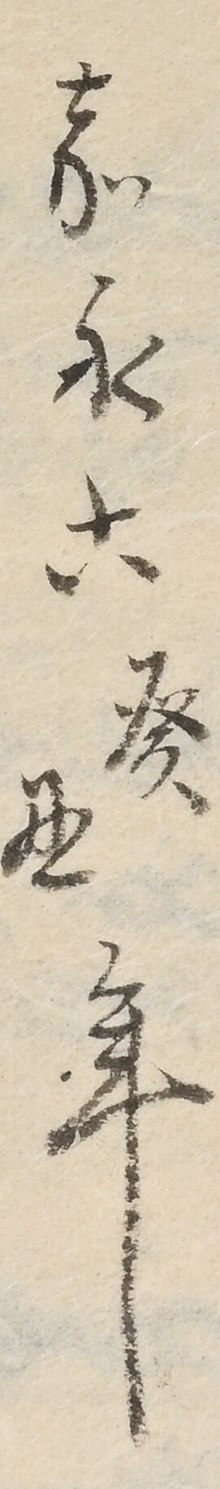嘉永六癸丑年
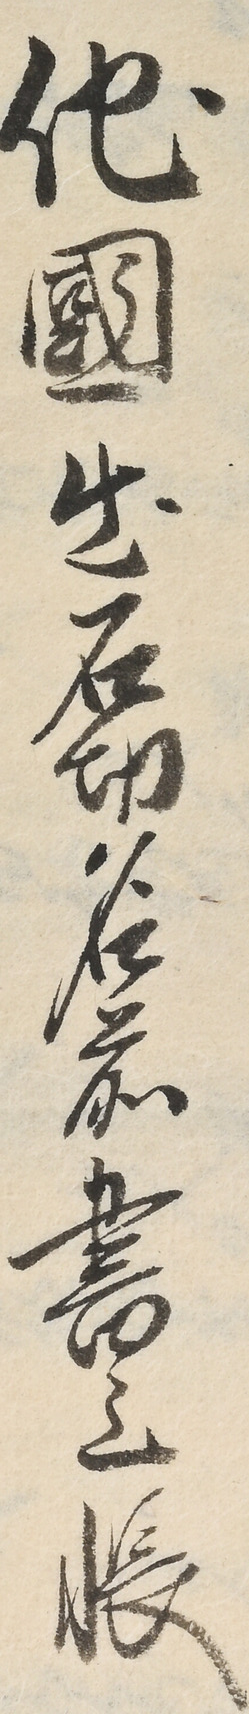他国出石切名前書上帳
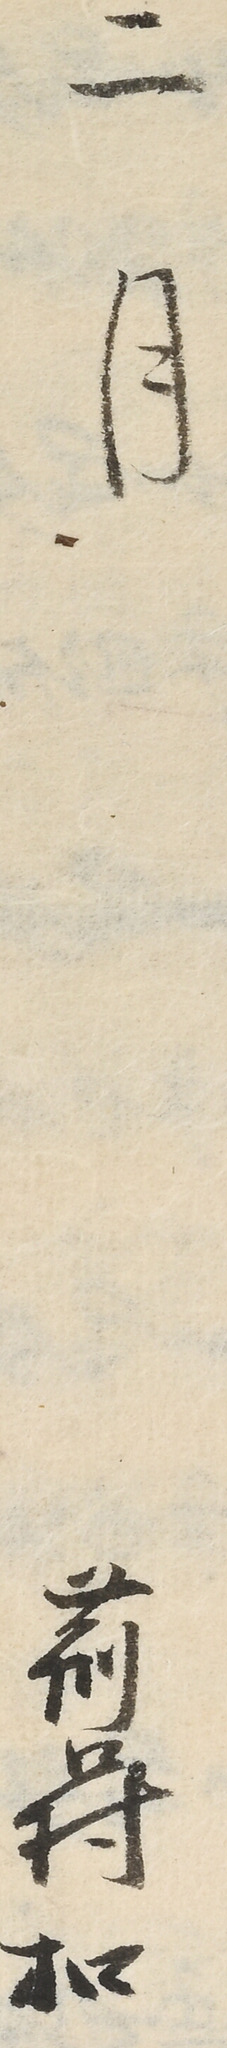二月荊口村扣

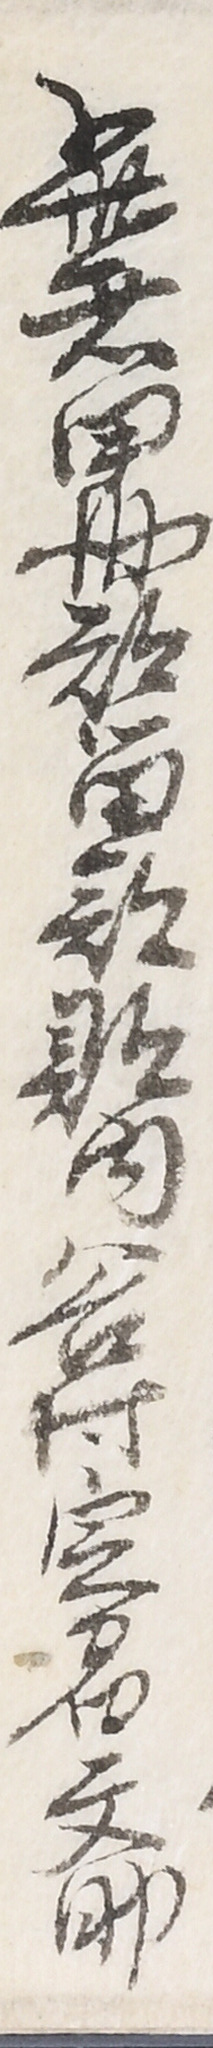此者甲州都留郡郡内谷村定宿文助
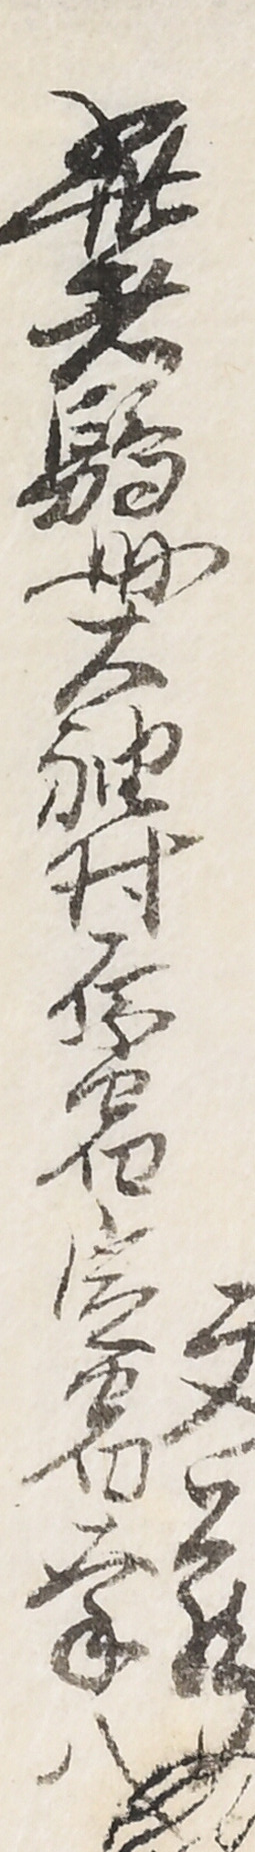此者駿州大袖村原宿定宿幸八
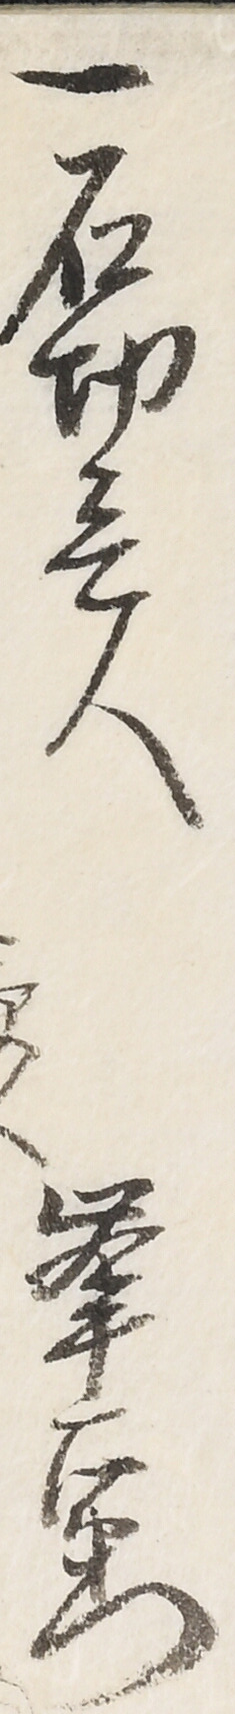一石切壱人峯右衛門
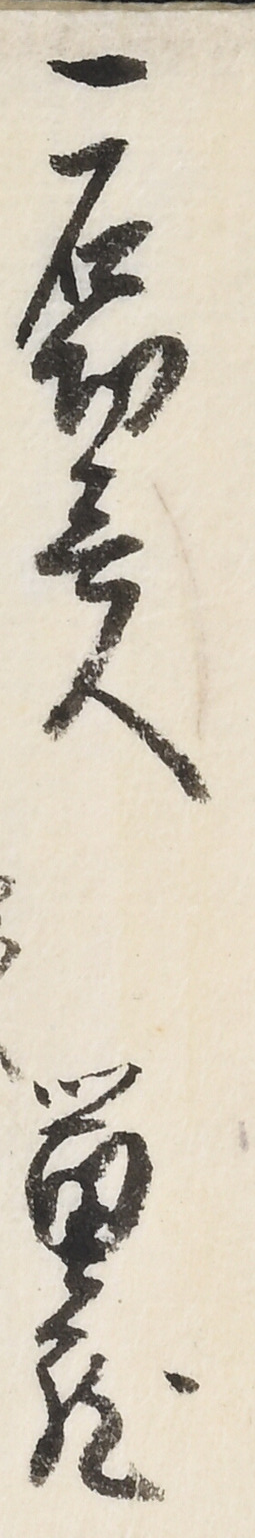一石切壱人富蔵
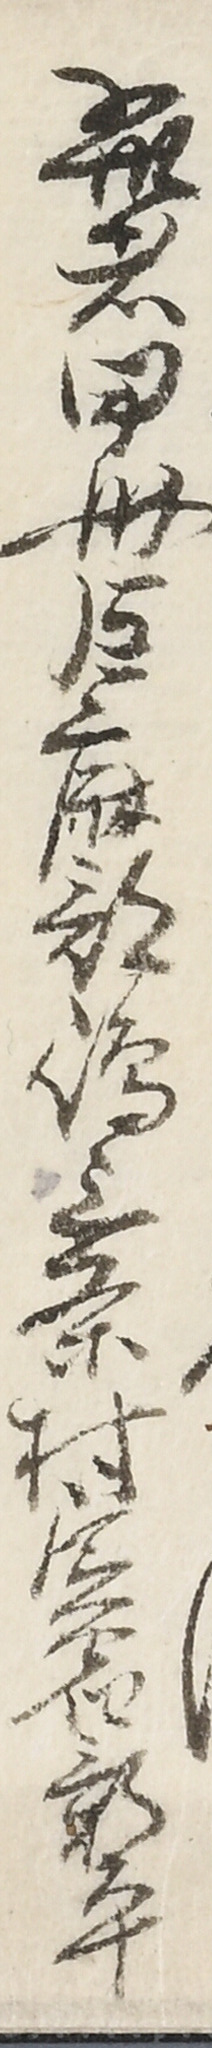此者甲州巨摩郡島上条村定宿新平
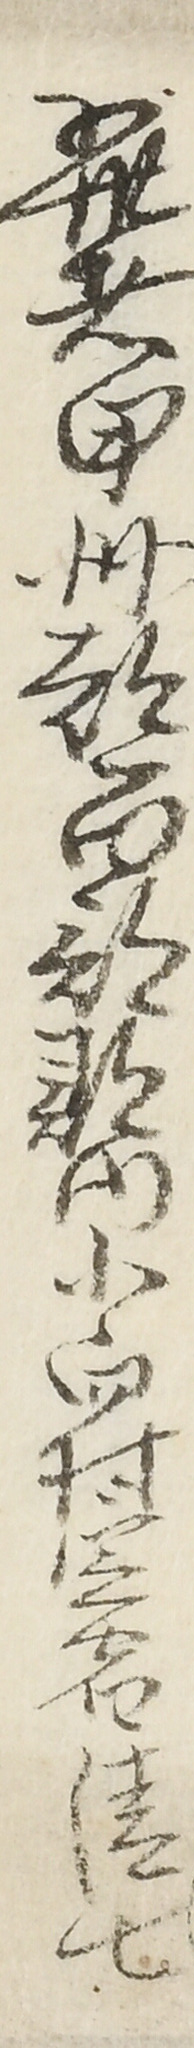此者甲州都留郡郡内小向村定宿清七
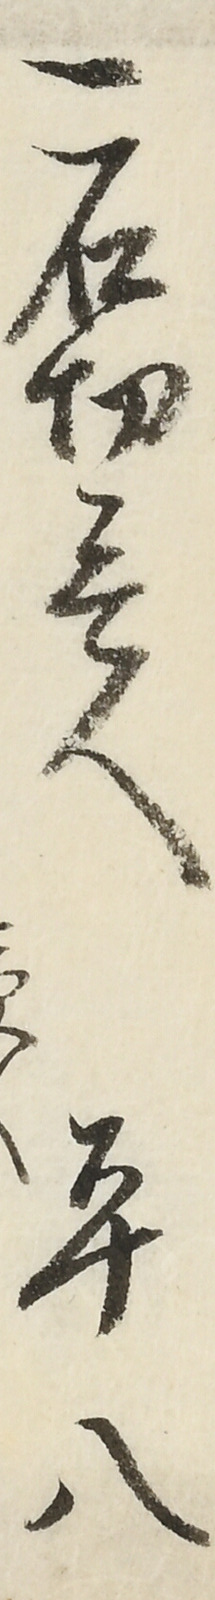一石切壱人平八
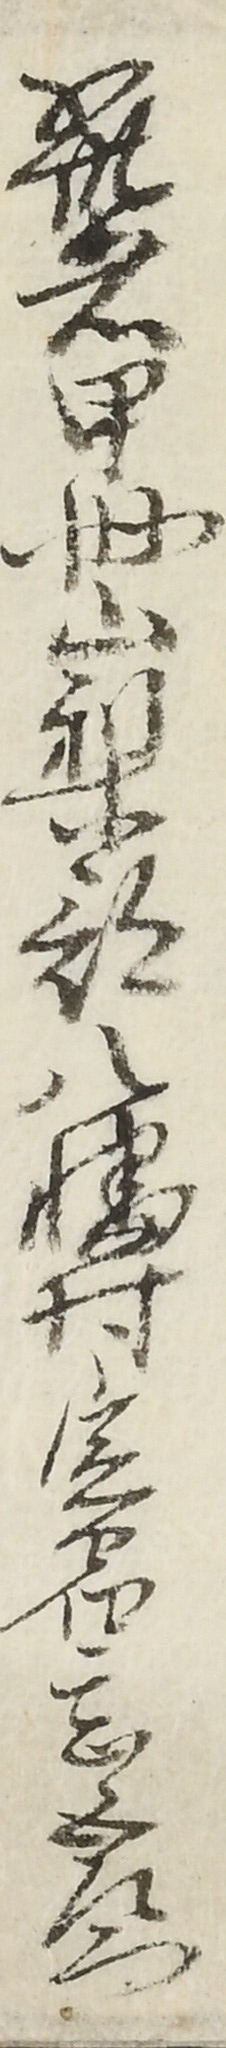此者甲州山梨郡八幡村定宿甚五左衛門

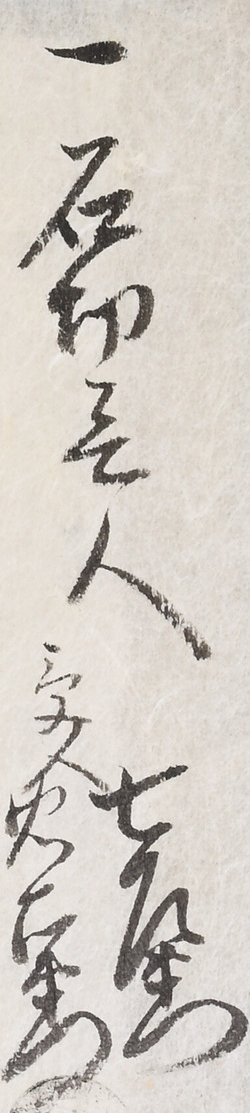一石切壱人七左衛門
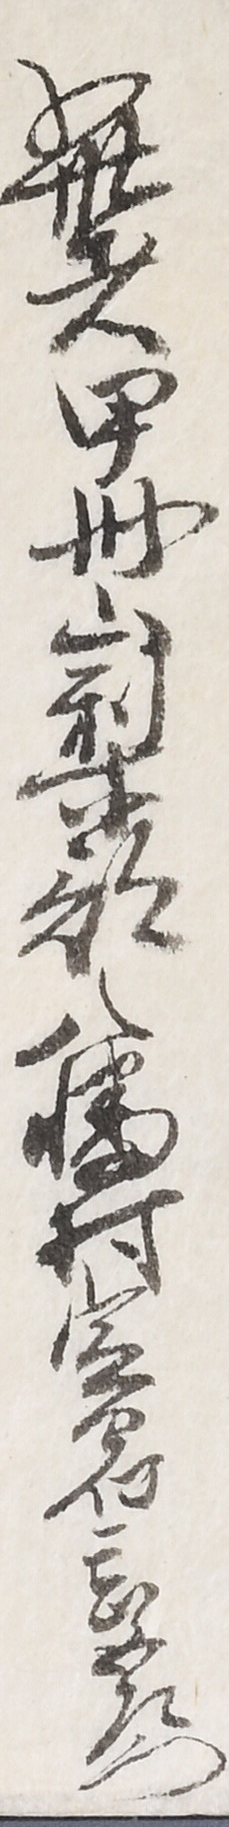此者甲州山梨郡八幡村定宿甚五左衛門
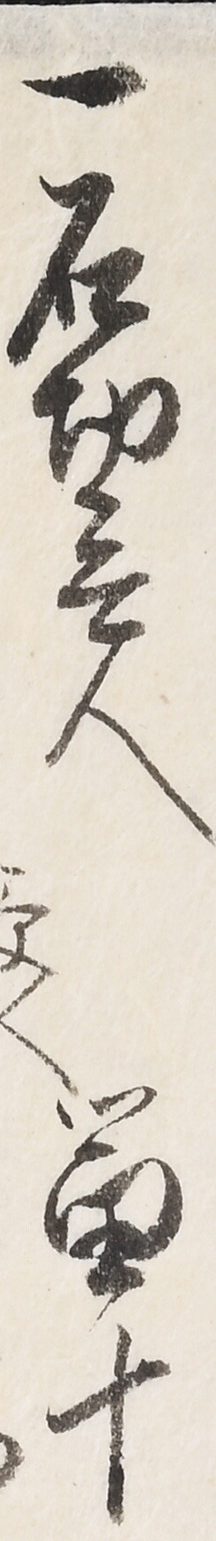一石切壱人富十
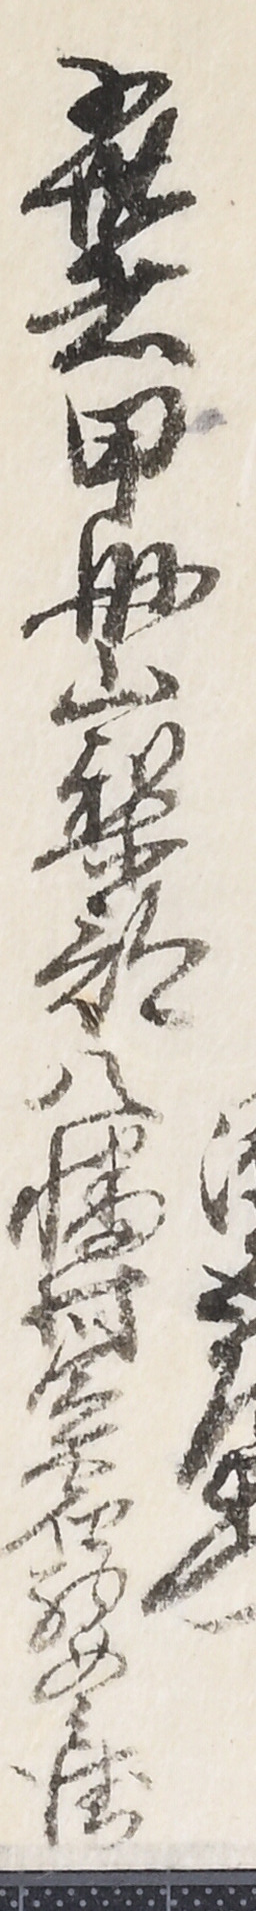此者甲州山梨郡八幡村定宿要兵衛
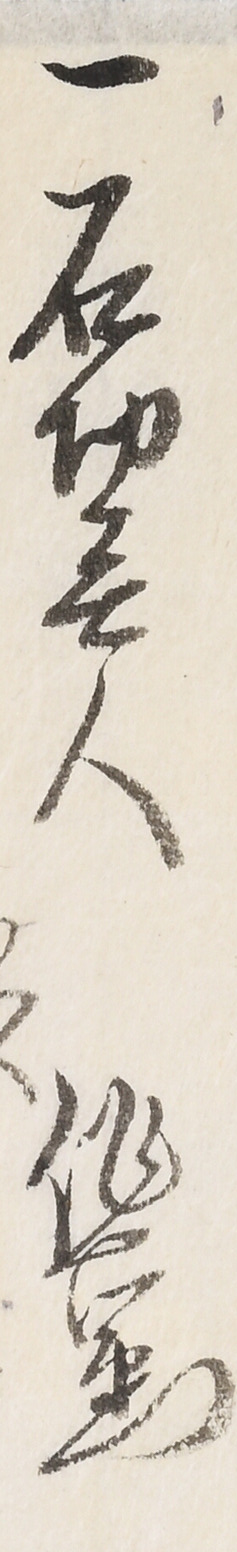一石切壱人作右衛門
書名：嘉永六癸丑年二月他國出石切名前書上帳
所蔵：伊那市立高遠町図書館・合同会社AMANE
